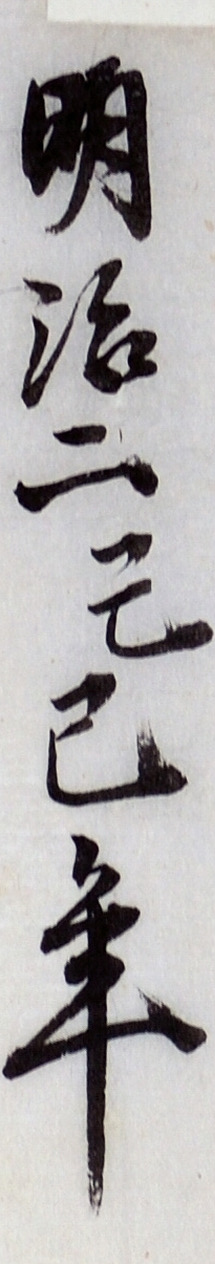明治二己巳年
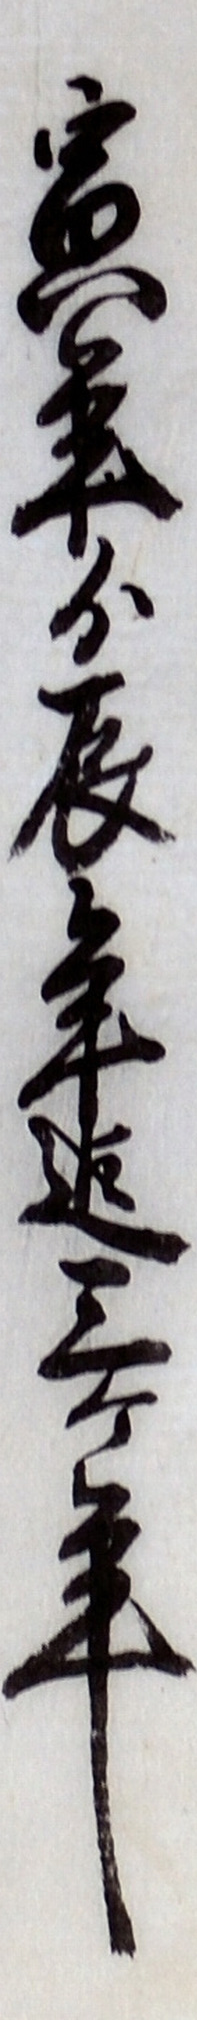寅年ヨリ辰年迄三ケ年
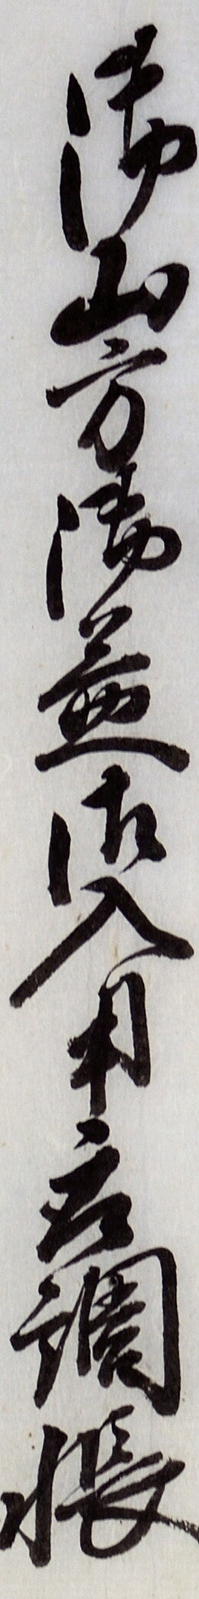御山方御益御入用取調帳
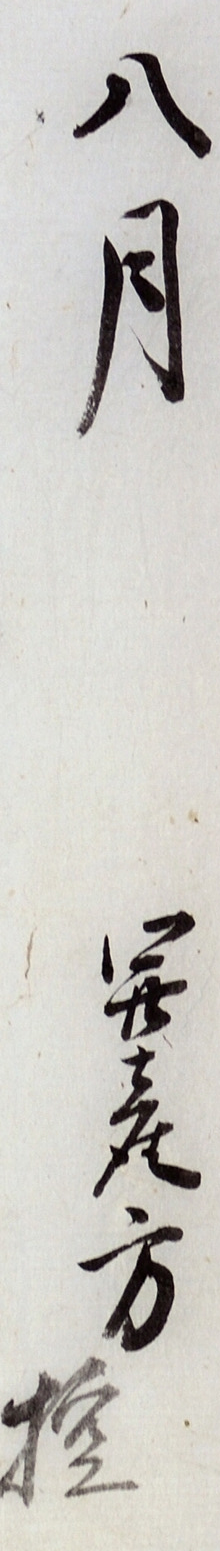八月開産方
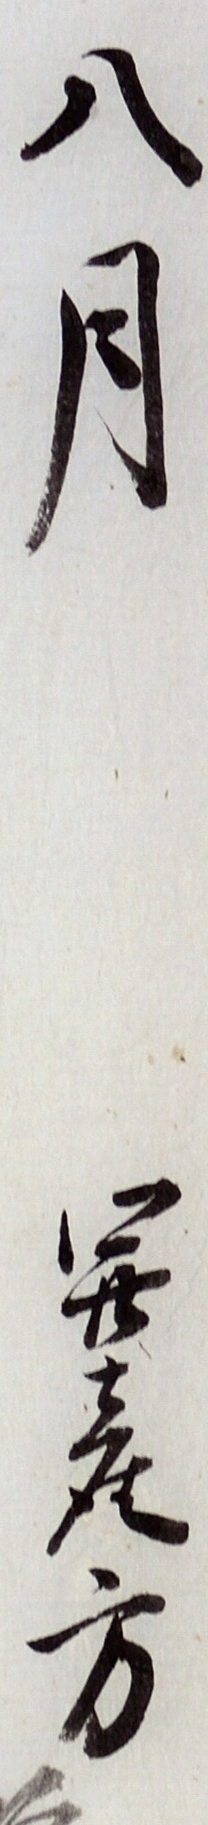八月開産方
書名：寅年ゟ辰年迄三ヶ年御山方御益御入用取調帳
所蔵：伊那市立高遠町図書館・合同会社AMANE
